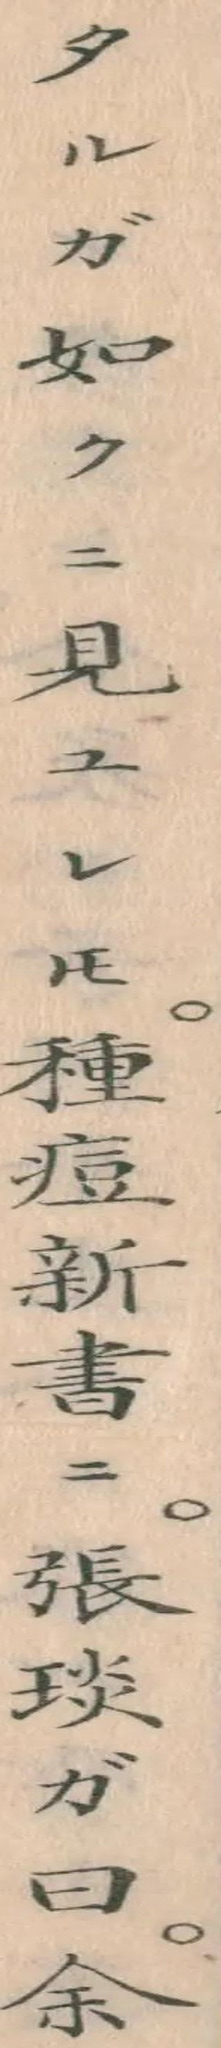タルガ如クニ見ユレ𪜈。種痘新書ニ。張琰ガ曰。余
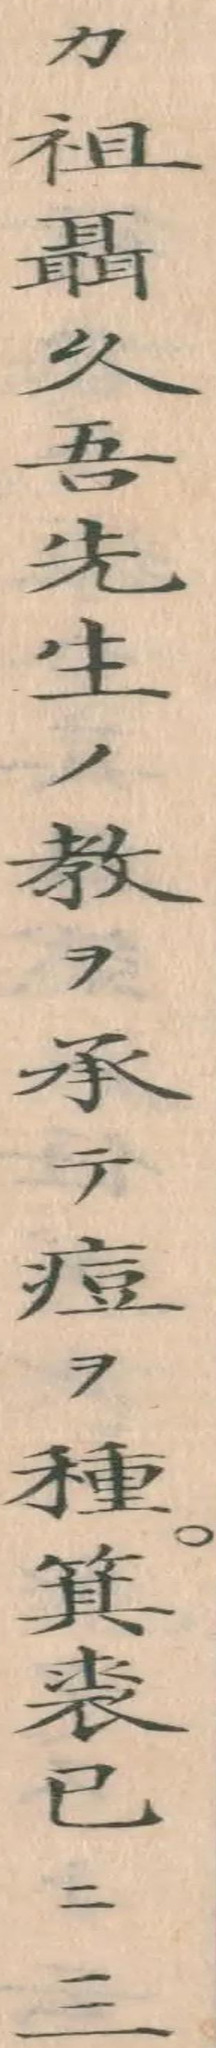カ祖聶久吾先生ノ教ヲ承テ痘ヲ種。箕裘已ニ三
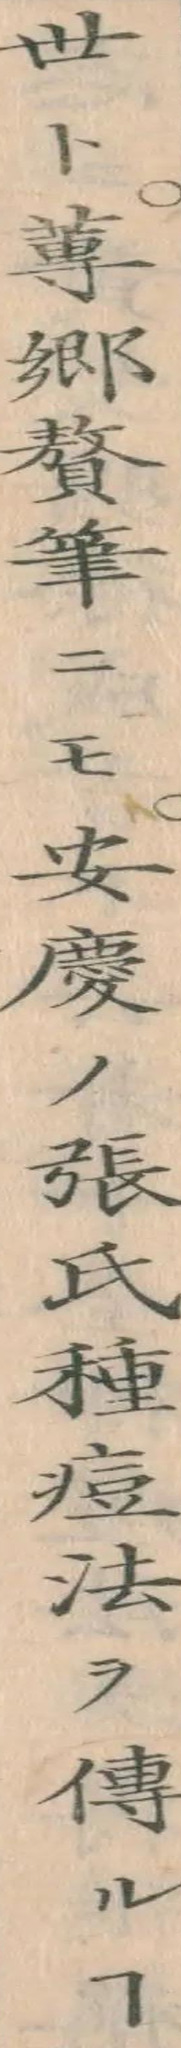世ト。蓴郷贅筆ニモ。安慶ノ張氏種痘法ヲ伝ルヿ
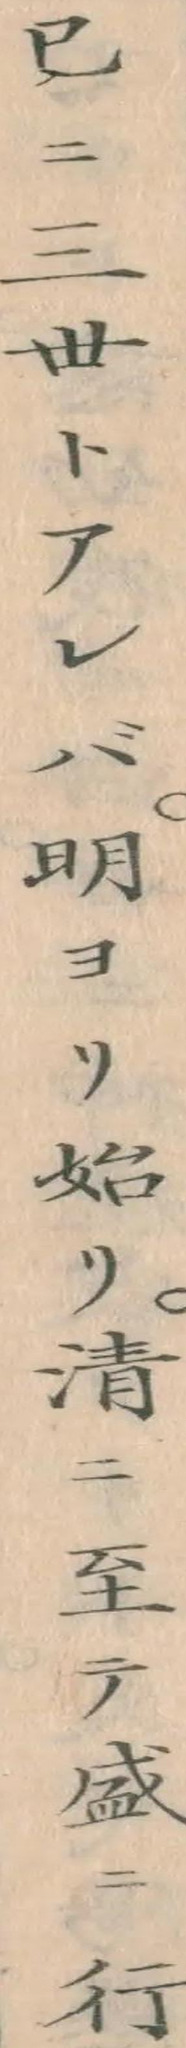已ニ三世トアレバ。明ヨリ始リ。清ニ至テ盛ニ行
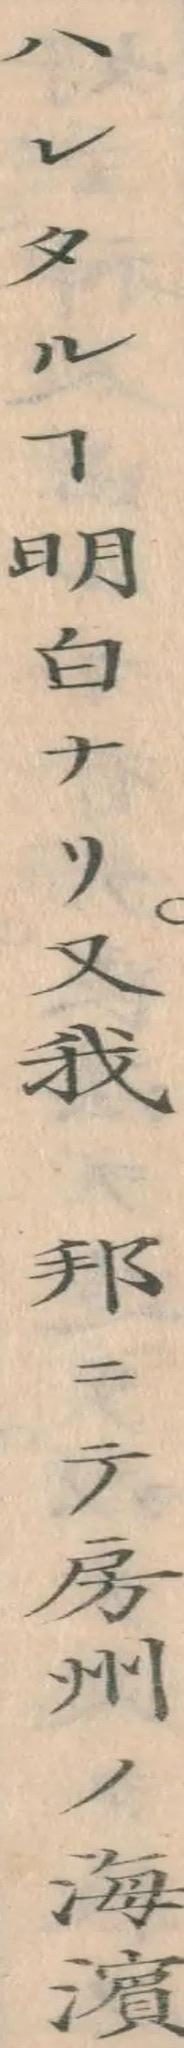ハレタルヿ明白ナリ。又我邦ニテ房州ノ海浜
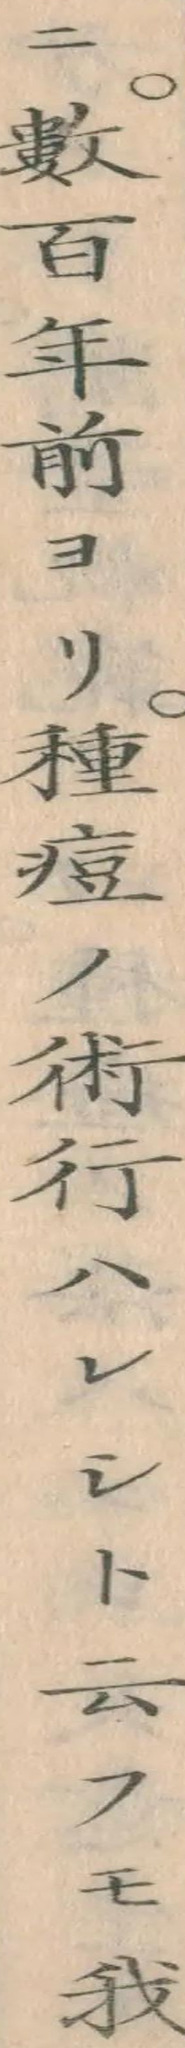ニ。数百年前ヨリ。種痘ノ術行ハレシト云フモ。我
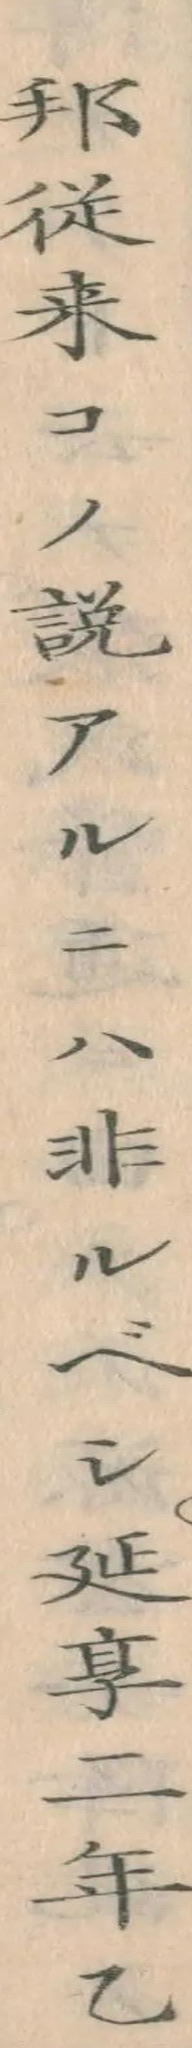邦従来コノ説アルニハ非ルベシ。延享二年乙
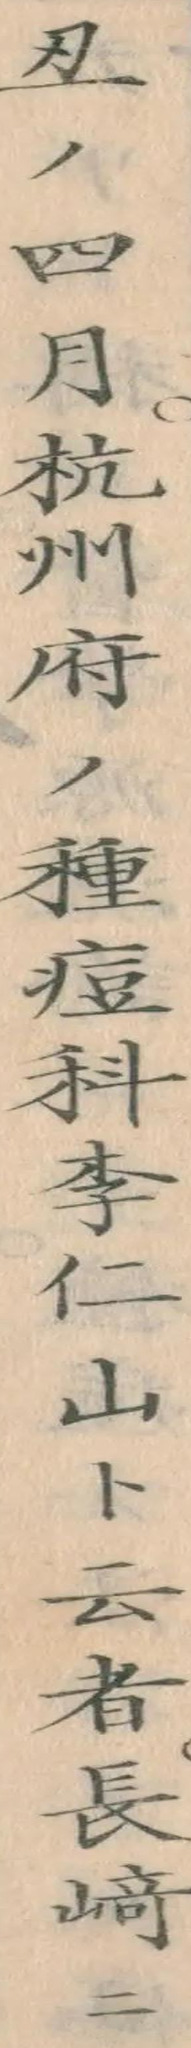丑ノ四月。杭州府ノ種痘科李仁山ト云者。長崎ニ
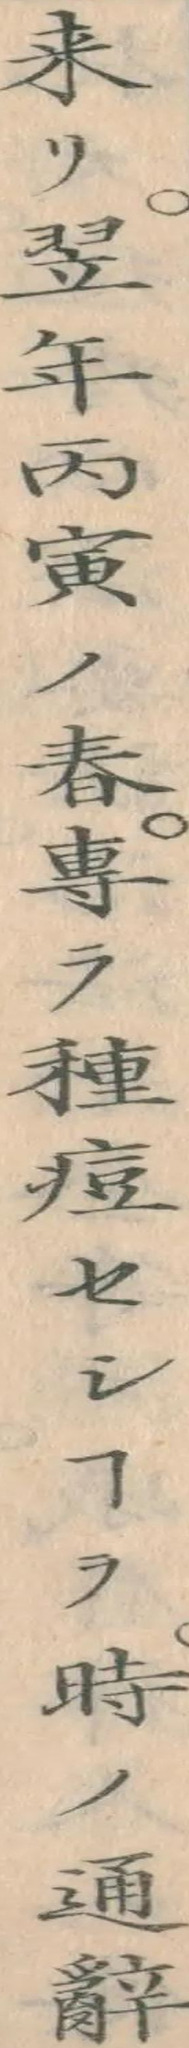来リ。翌年丙寅ノ春。専ラ種痘セシヿヲ。時ノ通辞
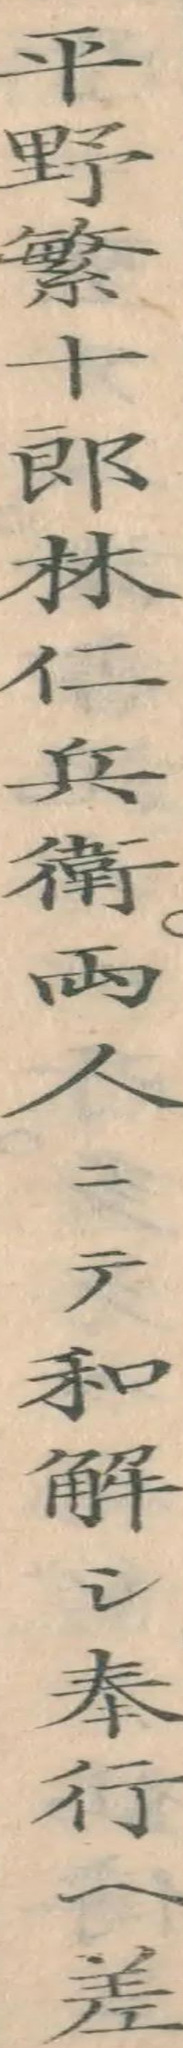平野繁十郎林仁兵衛。両人ニテ和解シ。奉行ヘ差
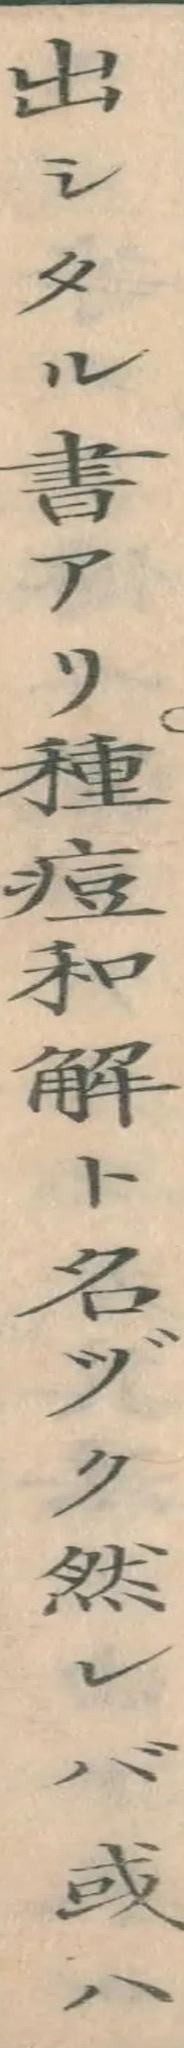出シタル書アリ。種痘和解ト名ヅク然レバ。或ハ

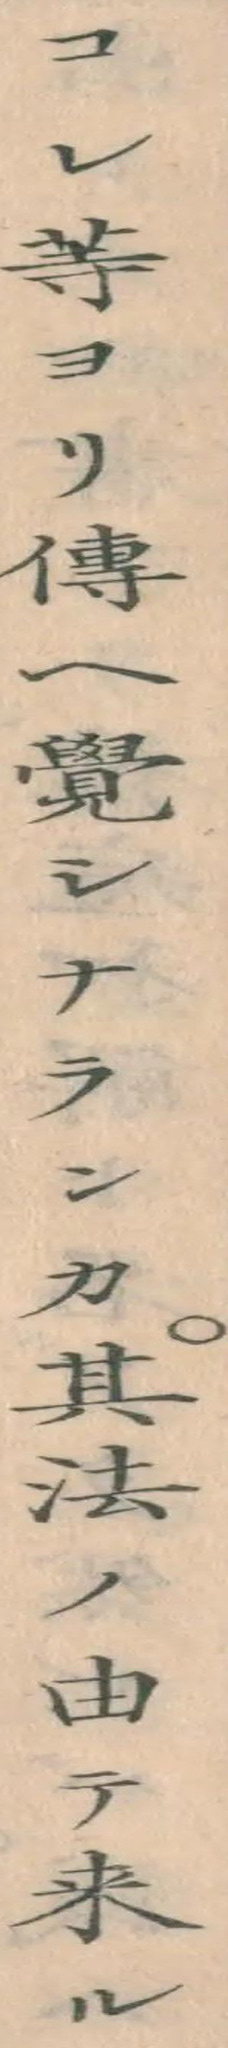コレ等ヨリ伝へ覚シナランカ。其法ノ由テ来ル
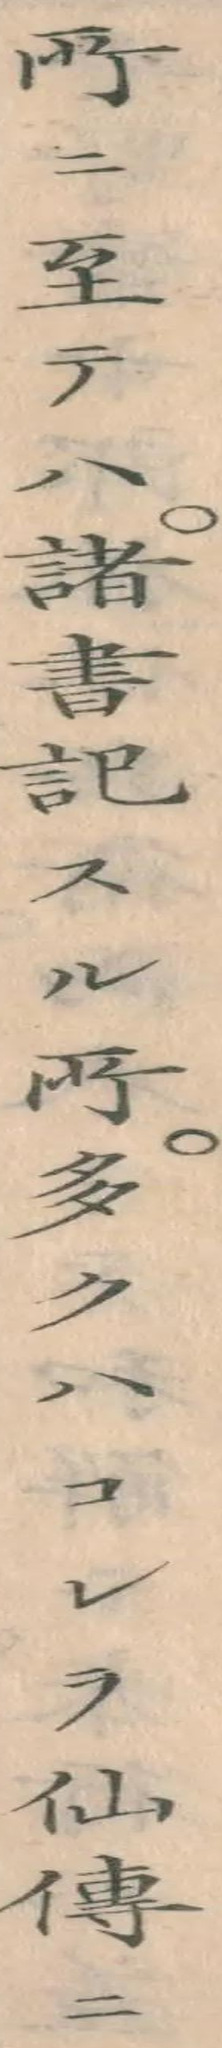所ニ至テハ。諸書記スル所。多クハコレヲ仙伝ニ
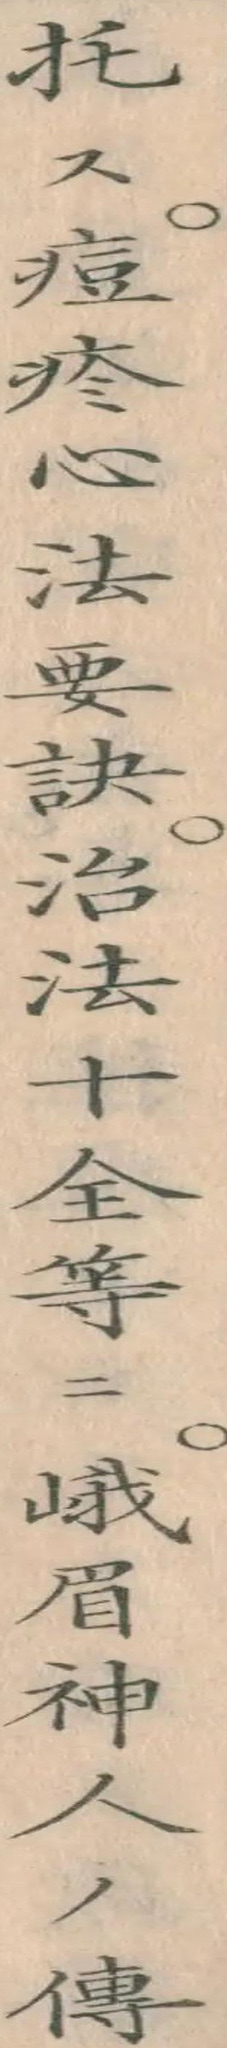托ス。痘疹心法要訣。治法十全等ニ。峨眉神人ノ伝
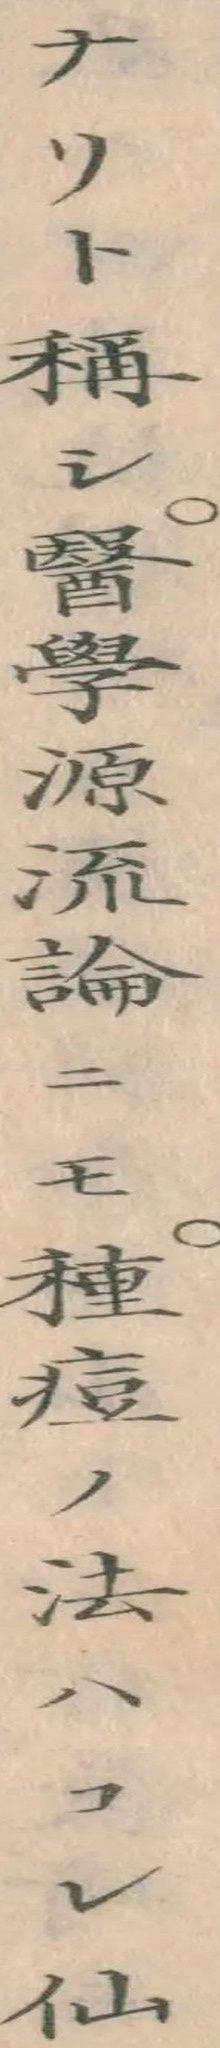ナリト称シ。医学源流論ニモ。種痘ノ法ハコレ仙
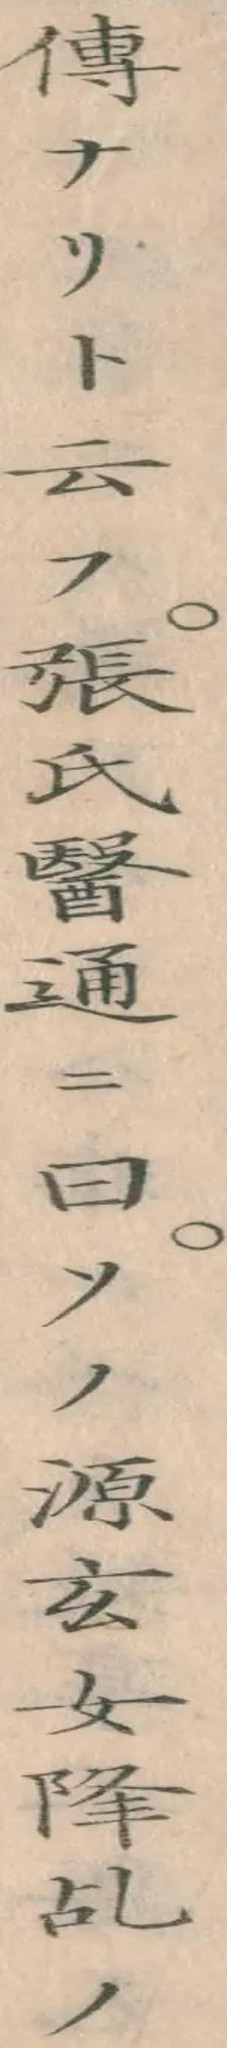伝ナリト云フ。張氏医通ニ曰。ソノ源玄女降乩ノ
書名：種痘弁義
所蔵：国立国会図書館 National Diet Library, JAPAN
